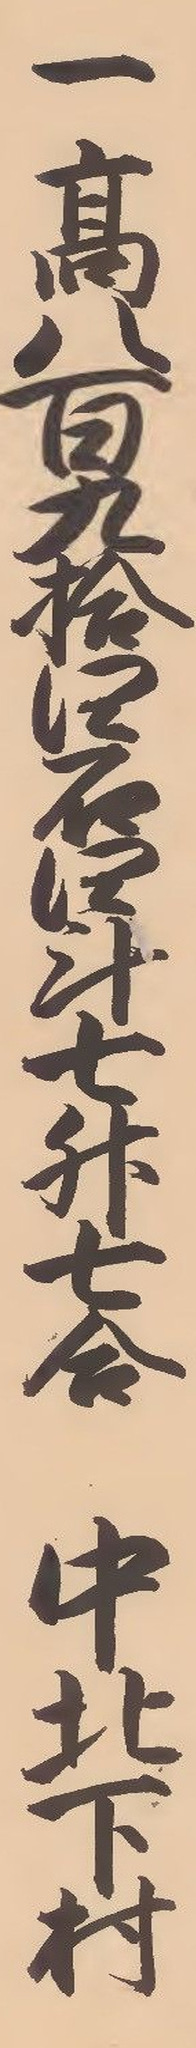一高八百九拾四石四斗七升七合中北下村
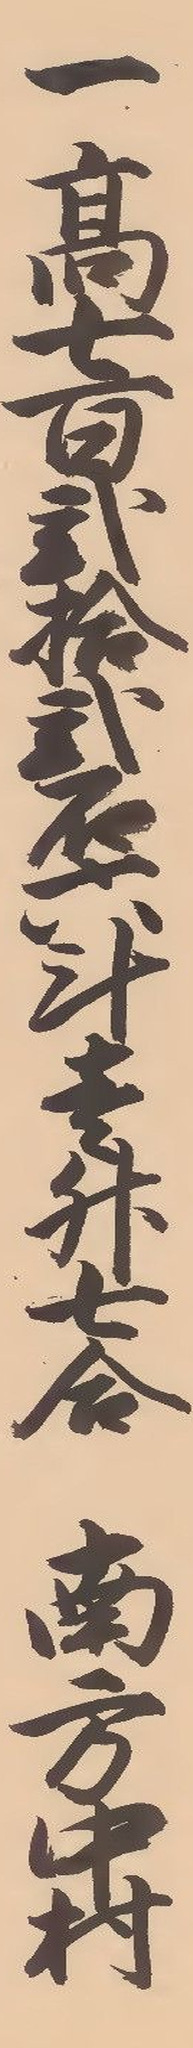一高七百弐拾弐石六斗壱升七合南方中村
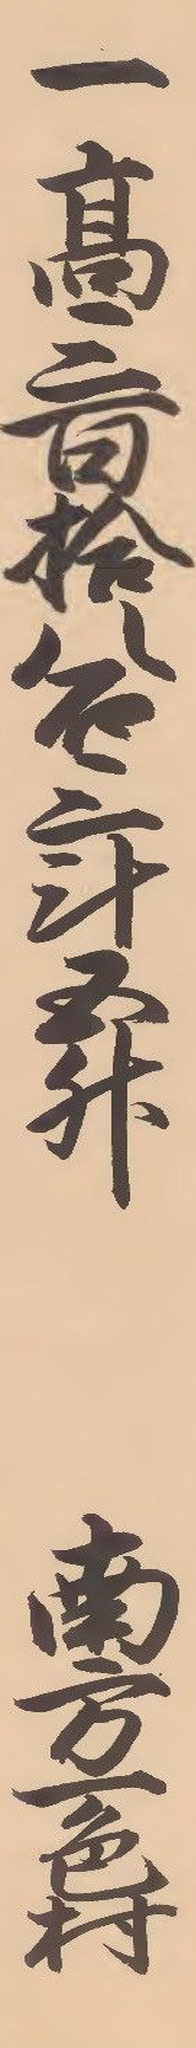一高三百拾八石三斗五升南方一色村

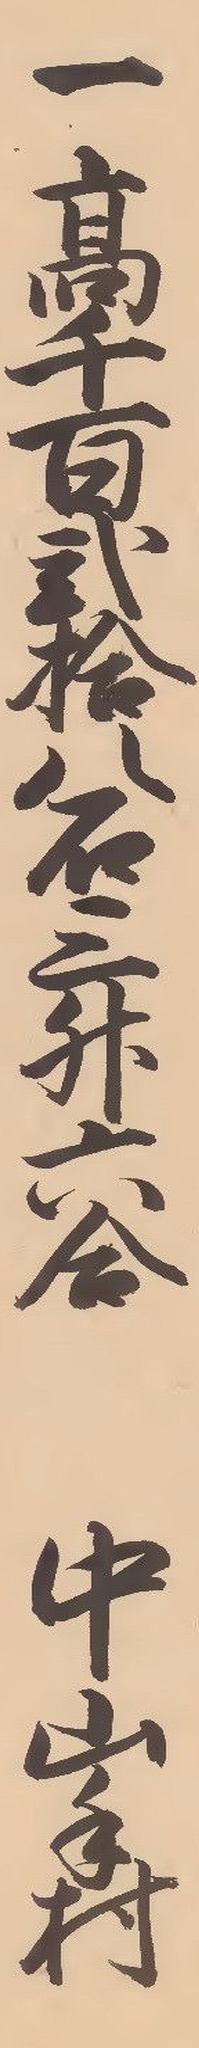一高千百弐拾八石三升六合中山手村
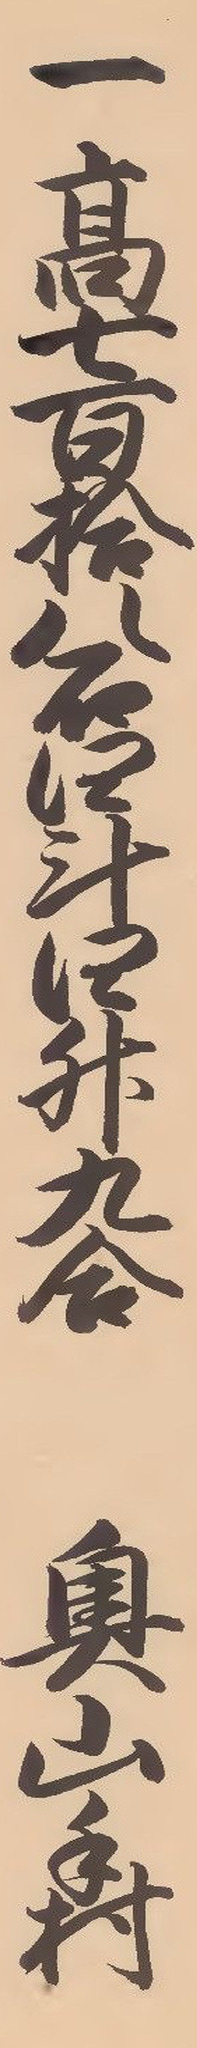一高七百拾八石四斗四升九合奥山手村
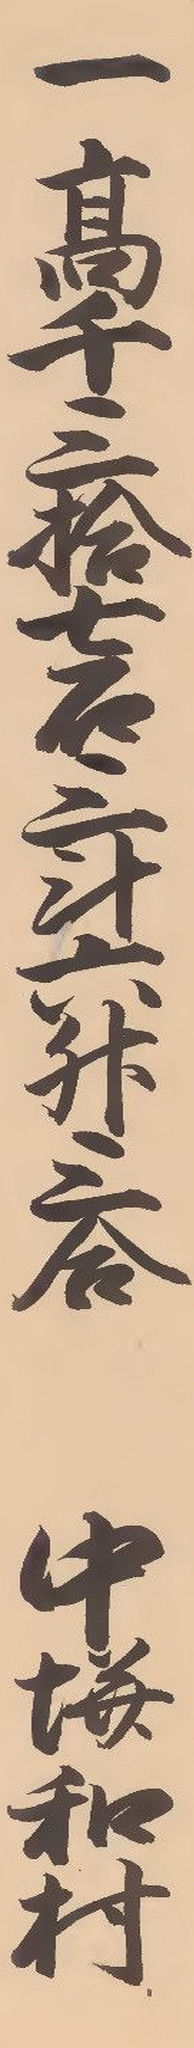一高千三拾七石三斗六升三合中塀和村
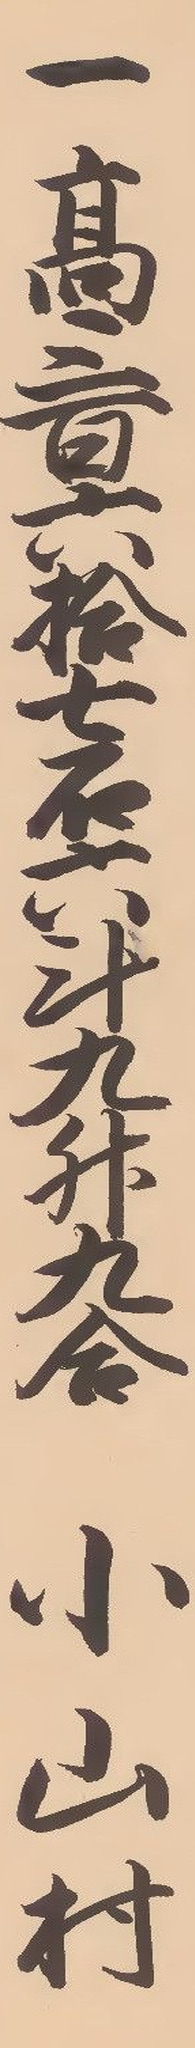一高三百六拾七石六斗九升九合小山村

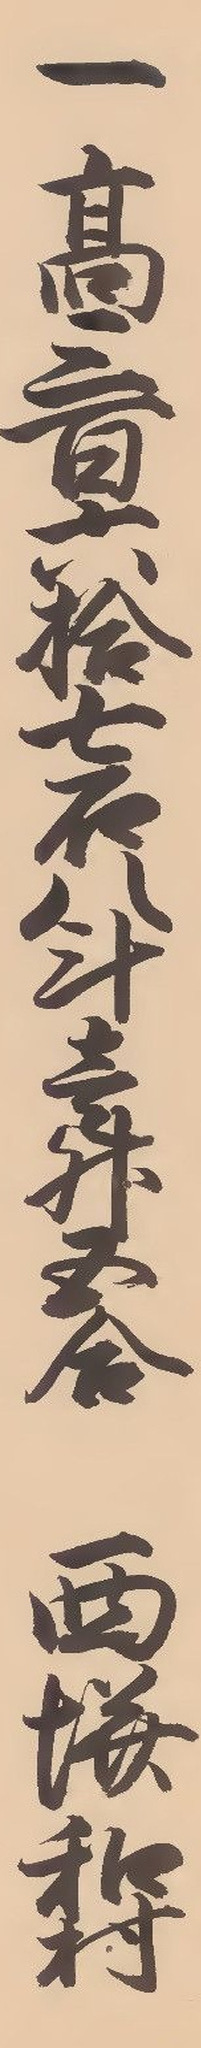一高三百六拾七石八斗壱升五合西塀和村
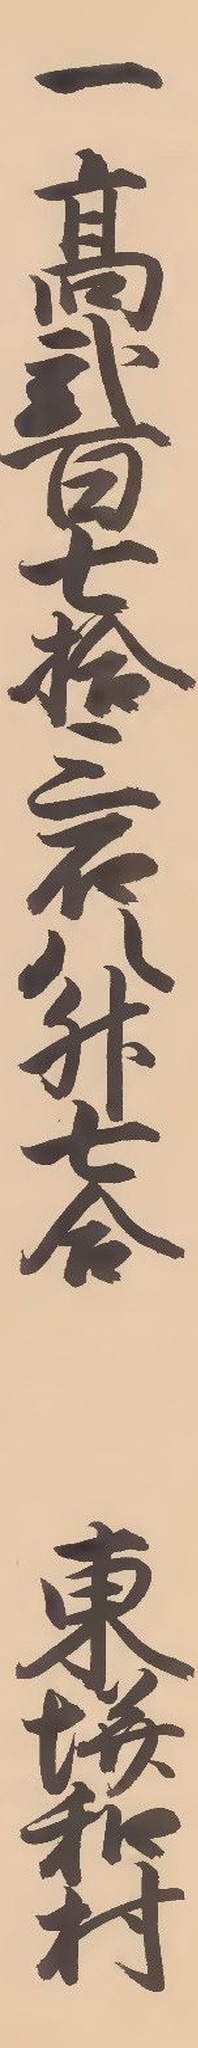一高弐百七拾三石八升七合東塀和村
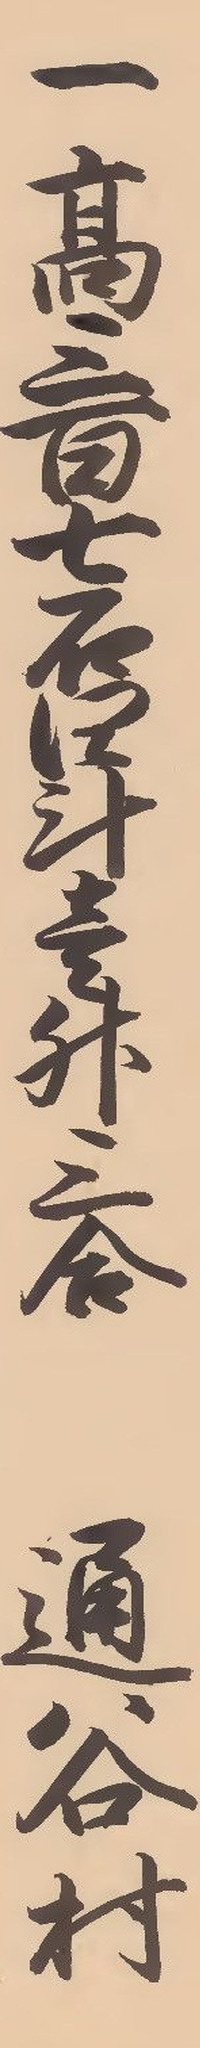一高三百七石四斗壱升三合通谷村
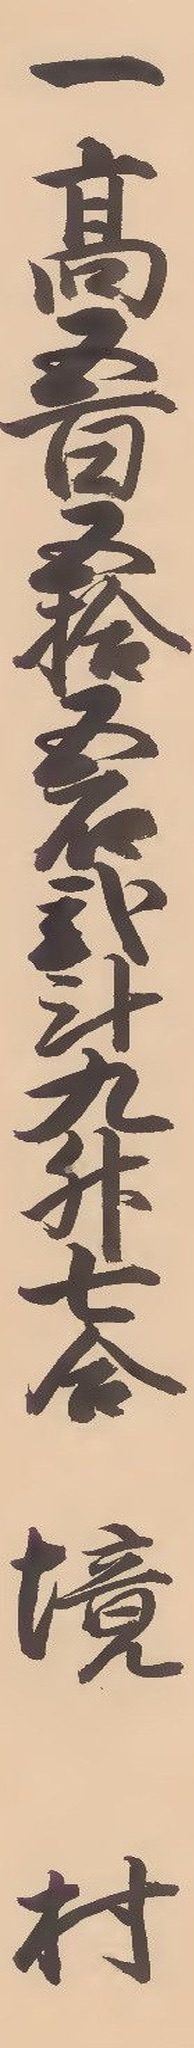一高五百五拾五石弐斗九升七合境村

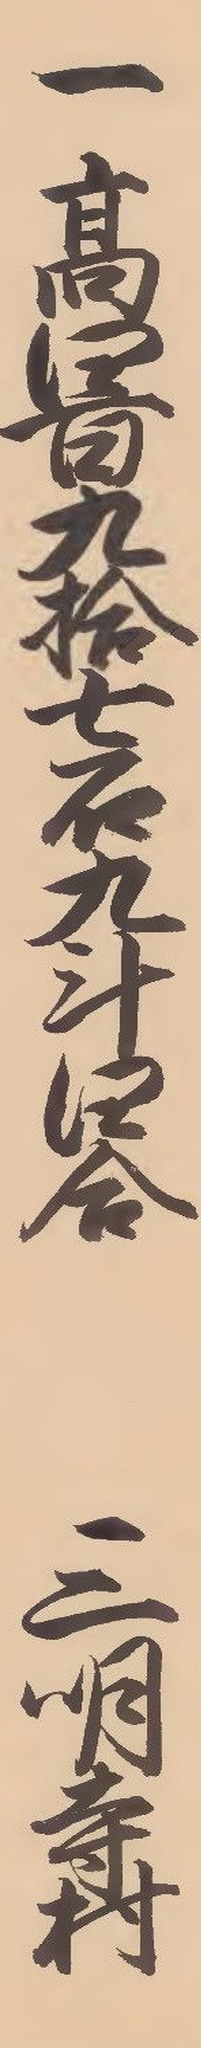一高四百九拾七石九斗四合三明寺村
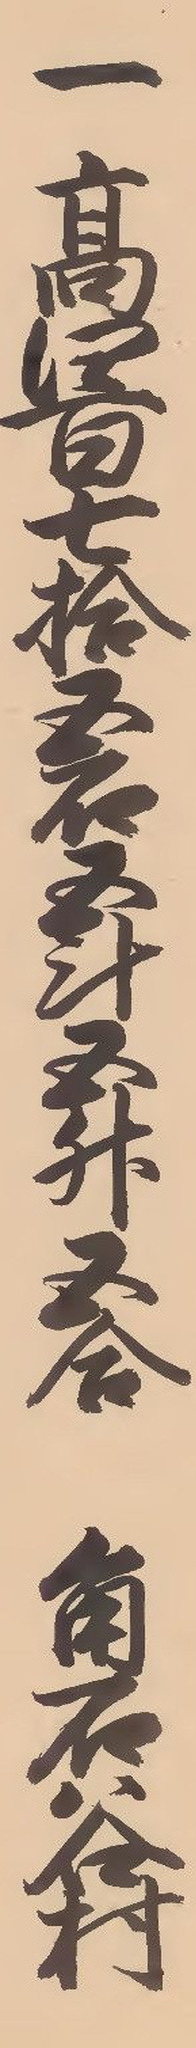一高四百七拾五石五斗五升五合角石谷村
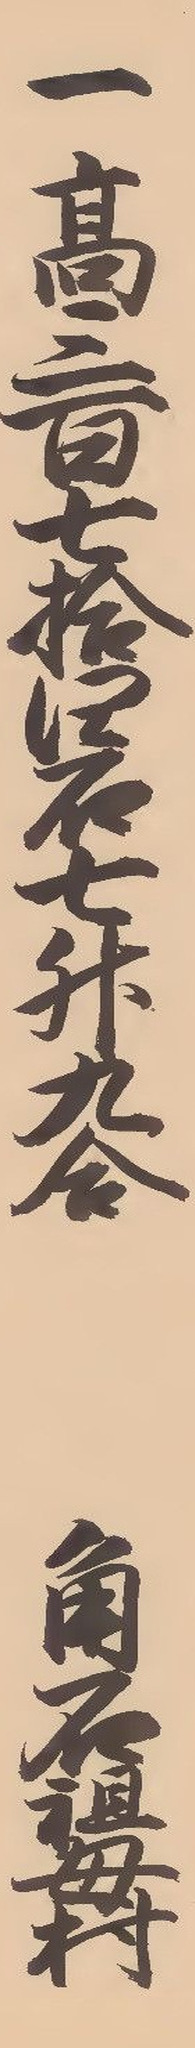一高三百七拾四石七升九合角石祖母村
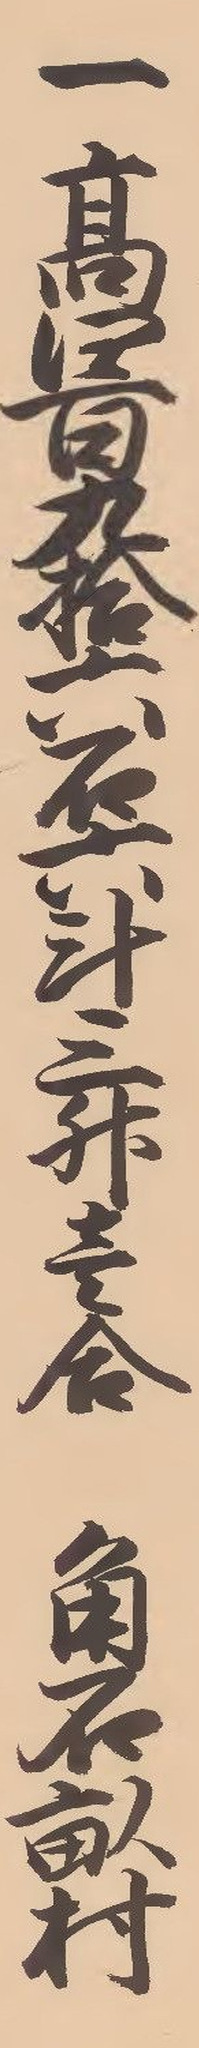一高四百九拾六石六斗三升壱合角石畝村

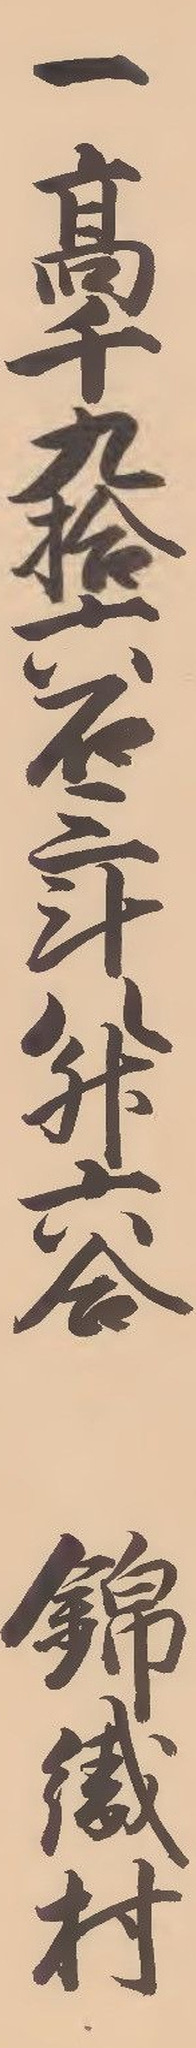一高千九拾六石三斗八升六合錦織村
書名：美作国郷帳
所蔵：国立公文書館 National Archives of Japan
